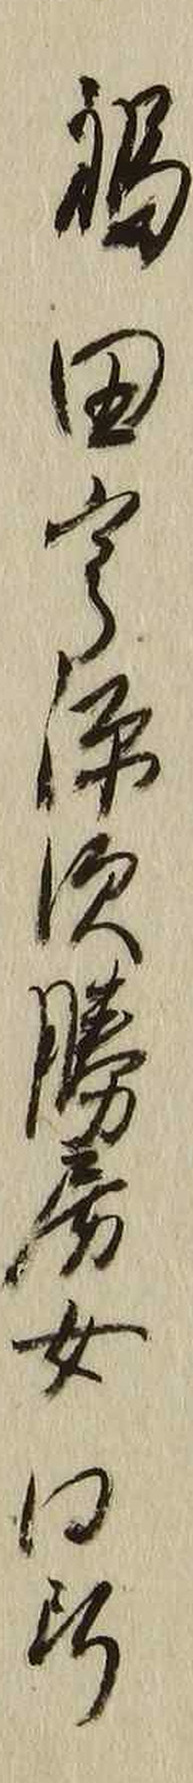福田宇源次勝房女同断
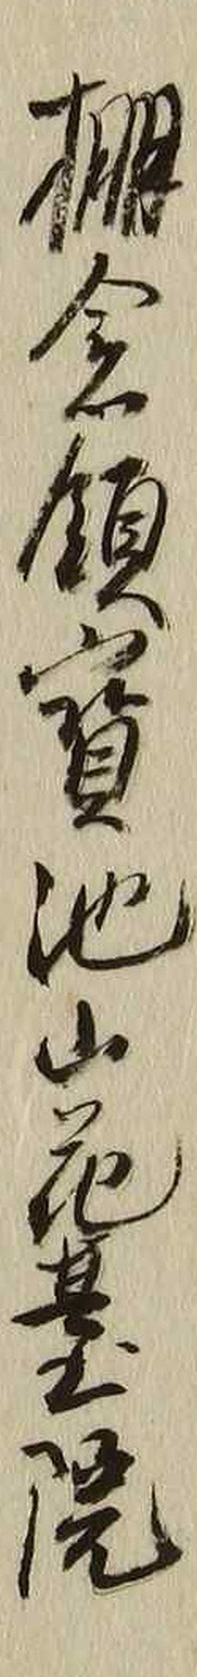棚倉領宝池山花台院
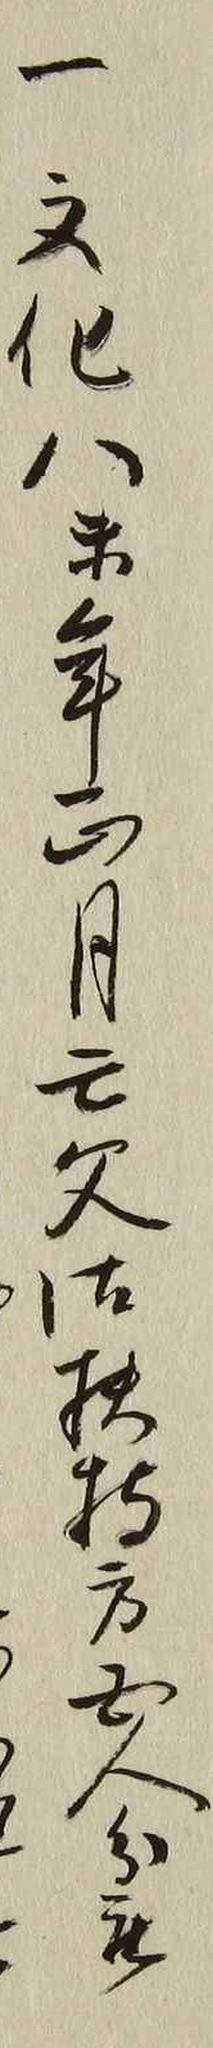一文化八未年正月亡父御扶持方五人分被
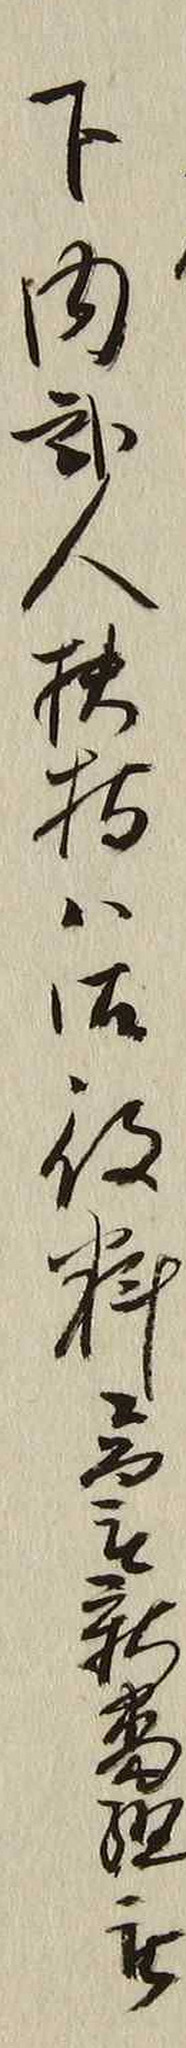下内弐人扶持ハ御役料ニ而被新番組被
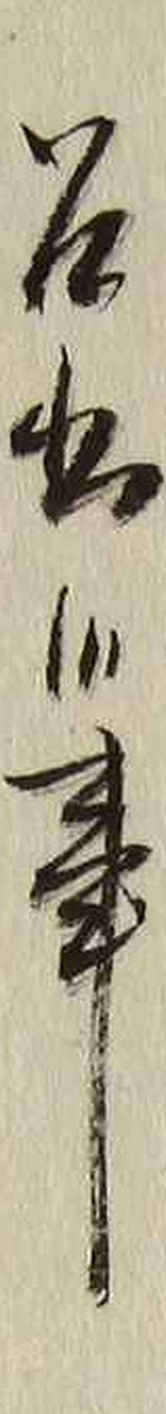召出候事
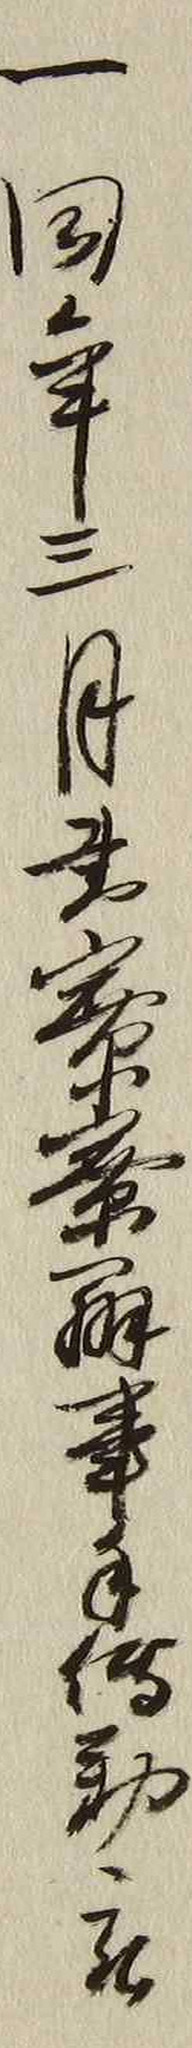一同年三月書寮寮弁事手伝勤被
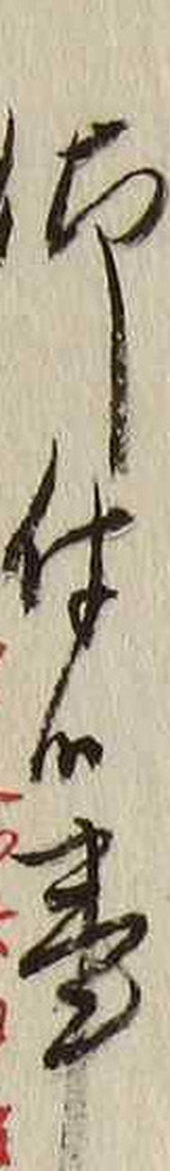仰付候事
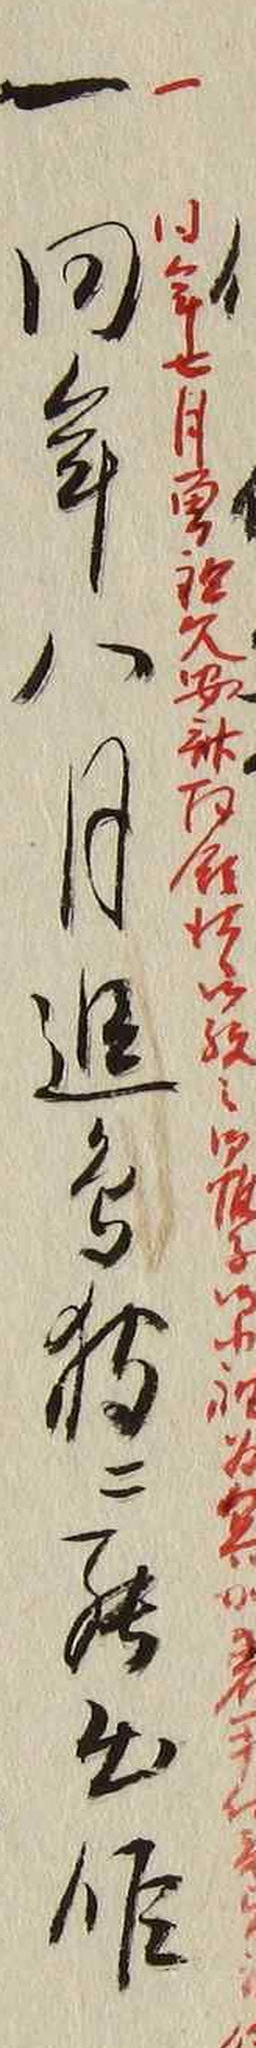一同年八月追鳥狩ニ罷出候
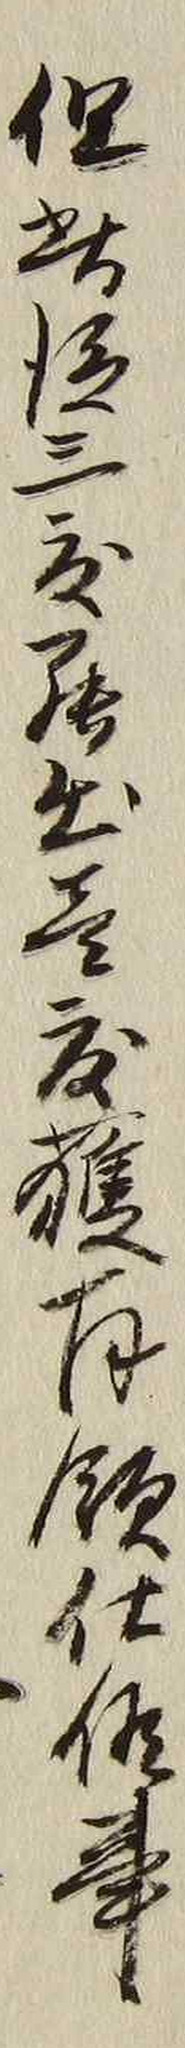但此後三度罷出壱度獲拝領仕候事
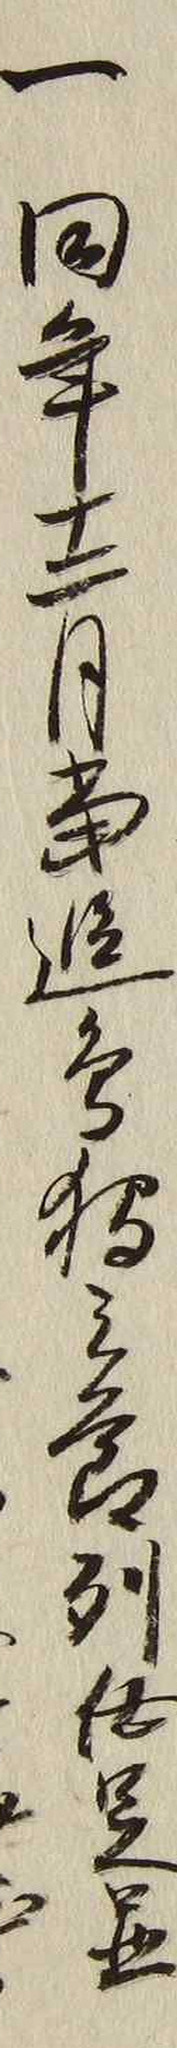一同年十二月当追鳥狩之節列伍足並
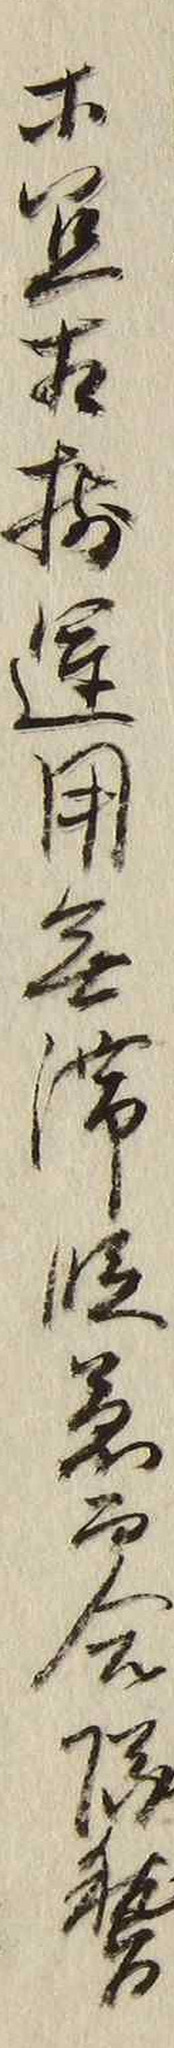等宜相揃運用無滞段兼而合隊稽
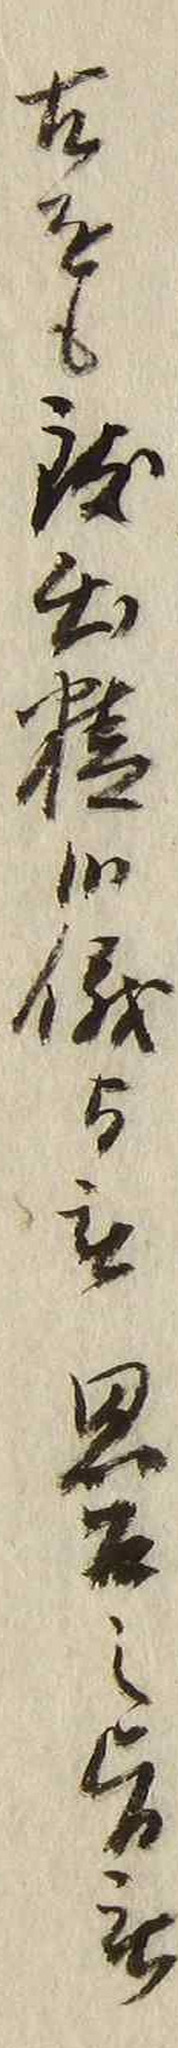古をも致出精候儀与被思召之旨被

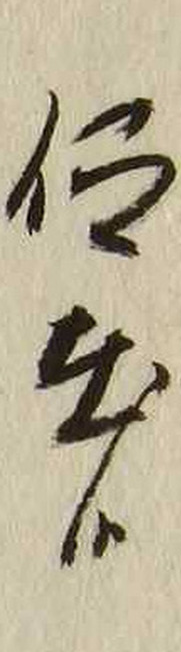仰出候
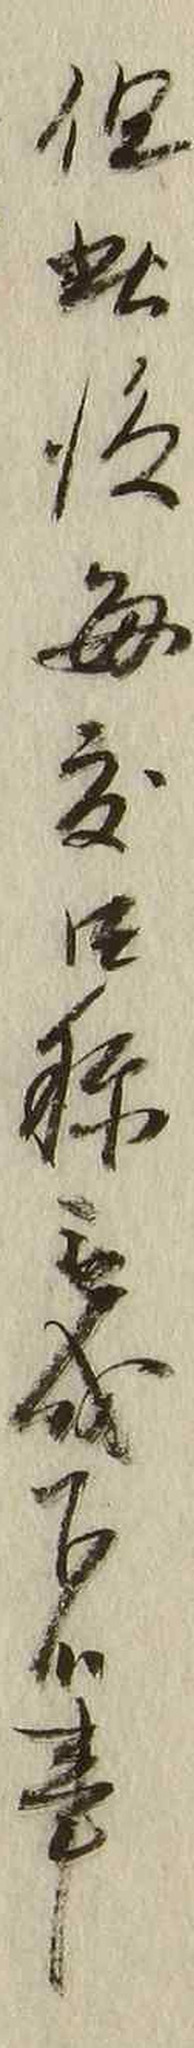但此後毎度御称被成下候事
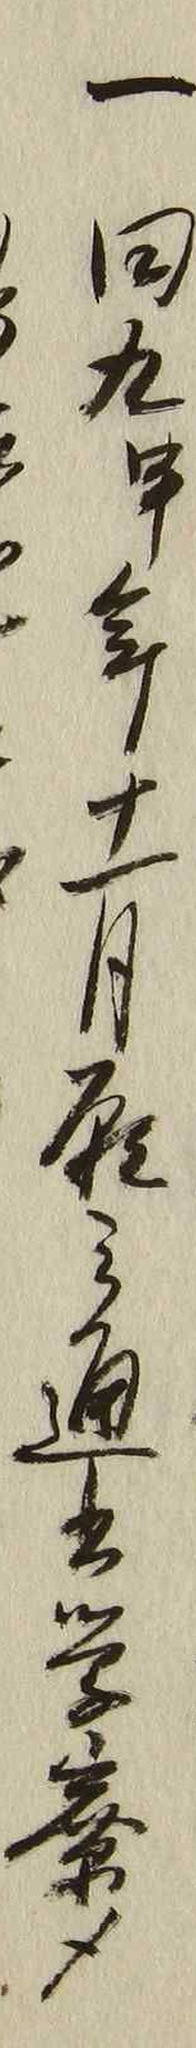一同九甲年十一月願之通書学景〆
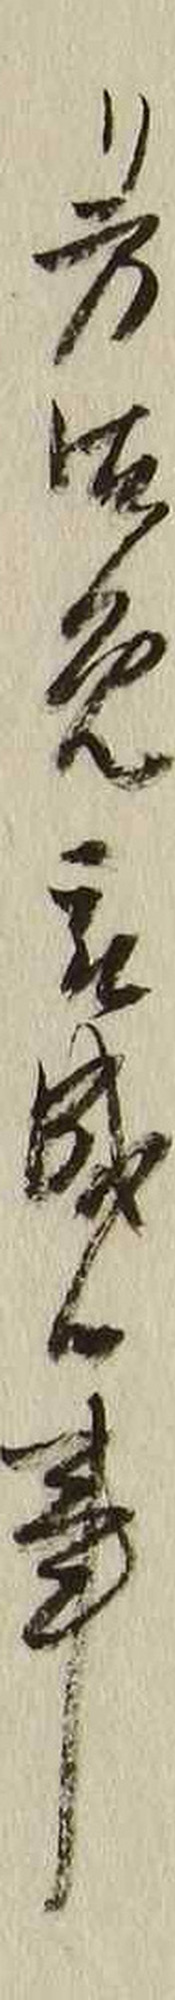り方御免被成候事
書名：諸士系譜　巻之349　も之部5
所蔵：会津若松市立会津図書館
